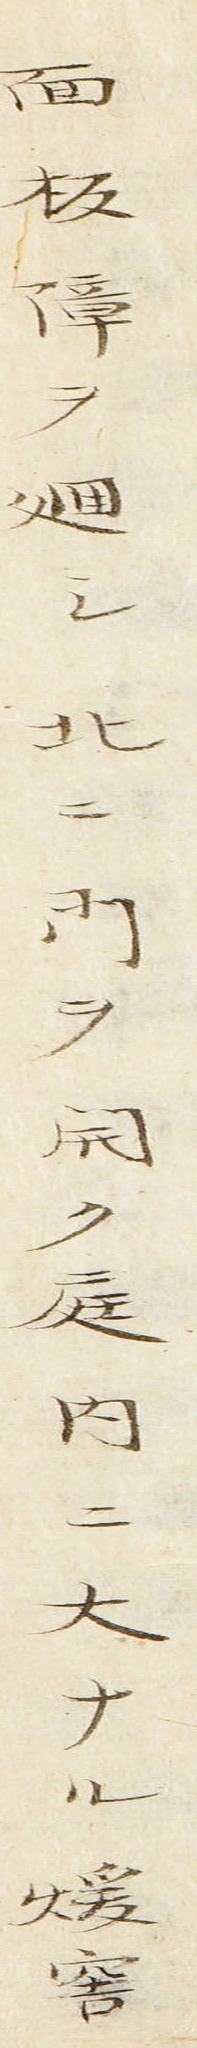面板障ヲ廻シ北ニ門ヲ開ク庭内ニ大ナル煖窖
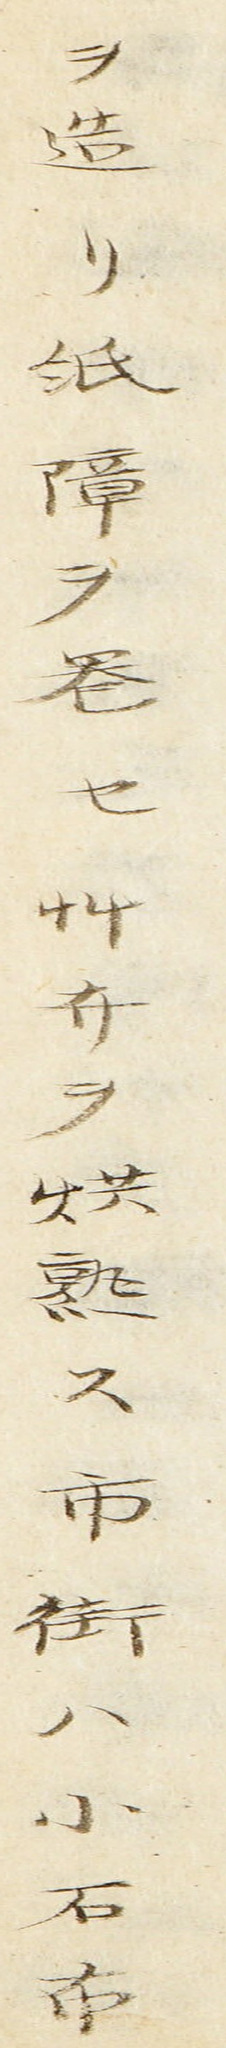ヲ造リ紙障ヲ罨セ艸𠦄ヲ烘熟ス市街ハ小石布

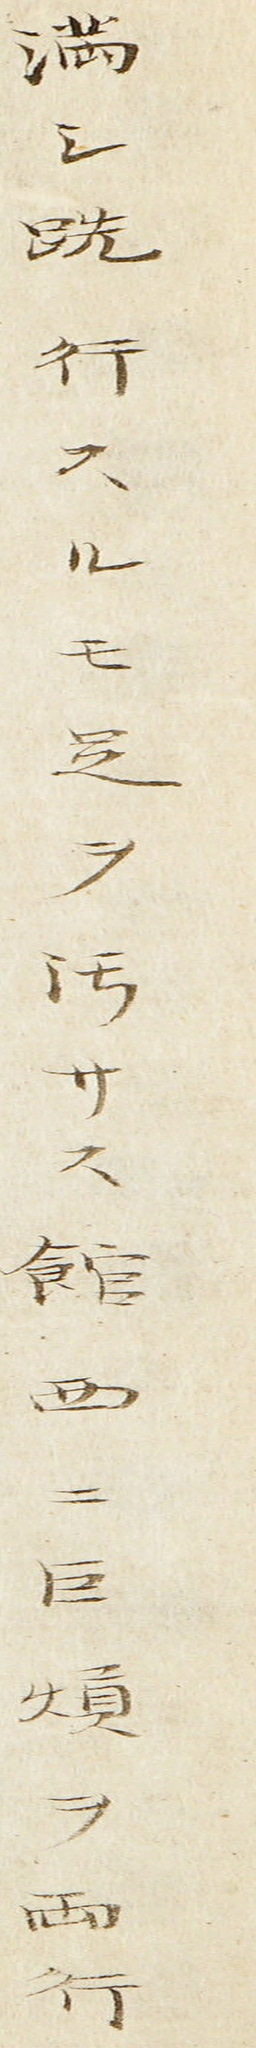満シ跣行スルモ足ヲ汚サス館西ニ巨熕ヲ両行
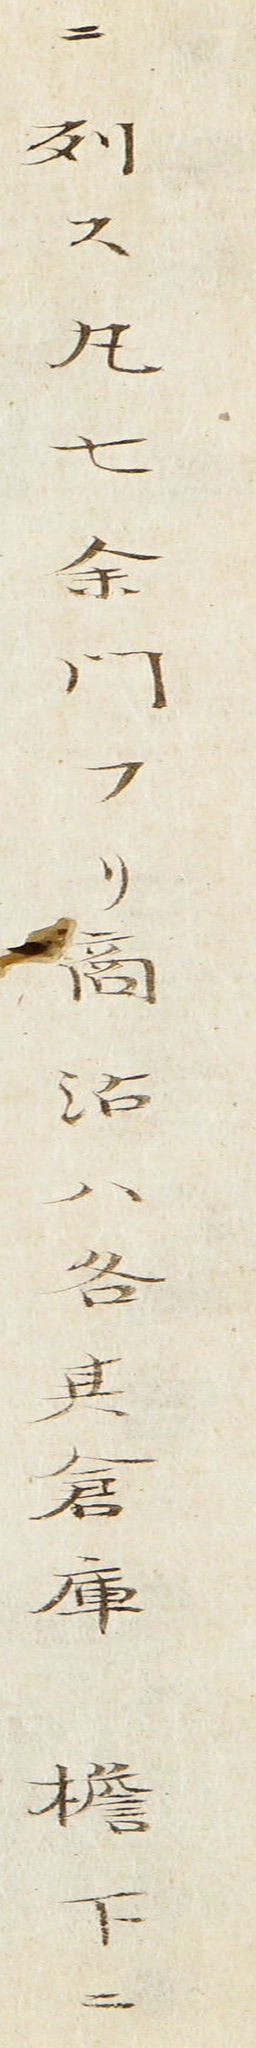ニ列ス凡七余門フリ商沽ハ各其倉庫檐下ニ
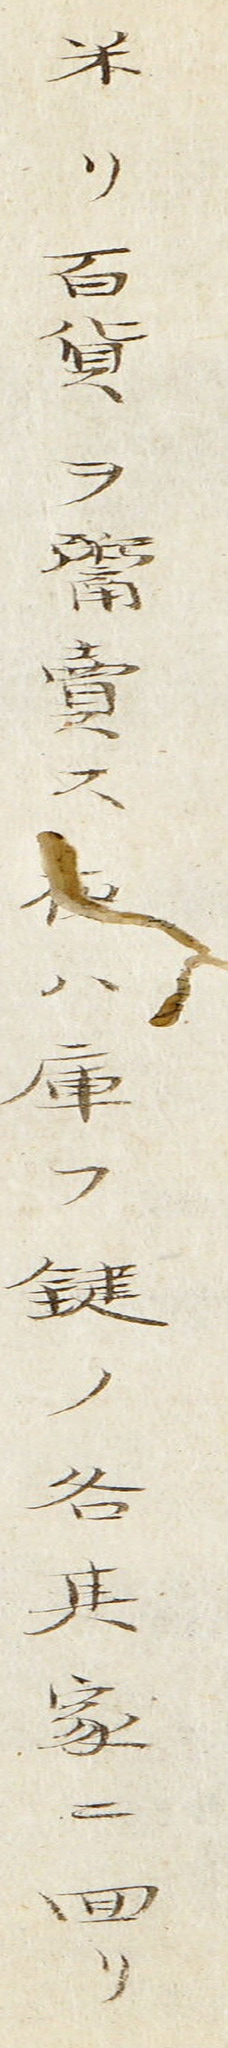来リ百貨ヲ鬻売ス夜ハ庫フ鍵ノ各其家ニ回リ
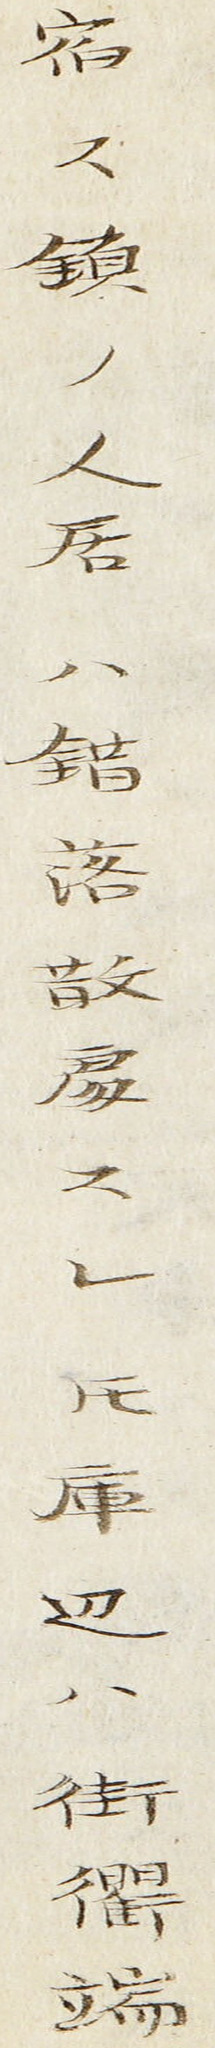宿ス鎮ノ人居ハ錯落散処スレトモ庫辺ハ街衢端
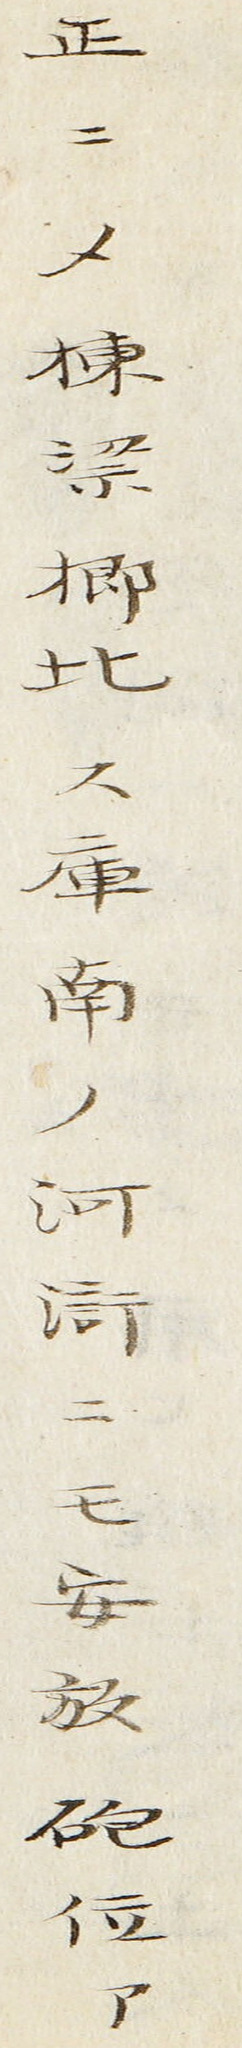正ニシテ棟梁榔比ス庫南ノ河滸ニモ安放砲位ア
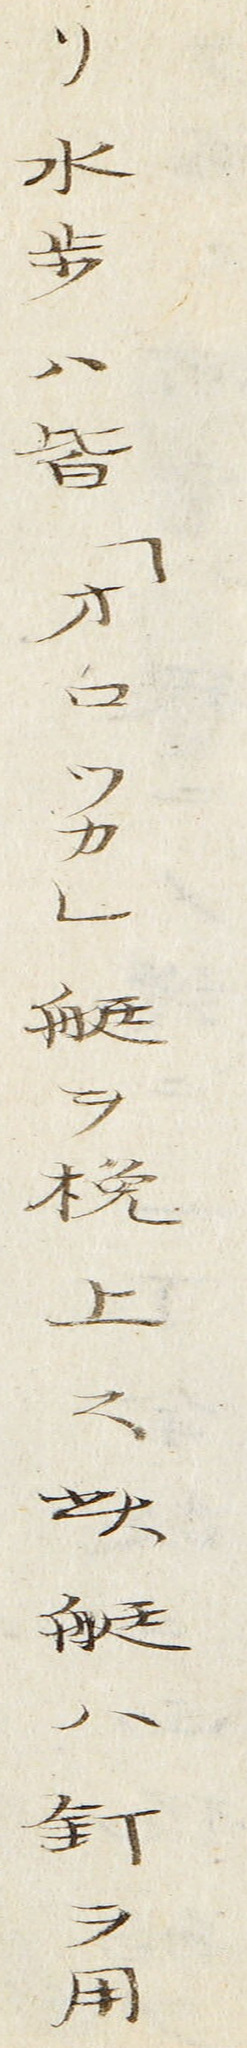リ水歩ハ皆「オロツカ」艇ヲ挽上ス此艇ハ釘ヲ用
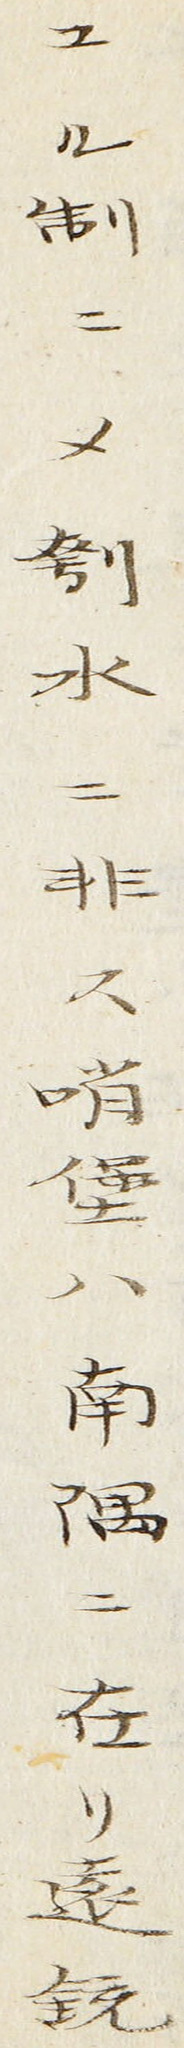ユル制ニシテ刳水ニ非ス哨堡ハ南隅ニ在リ遠鏡
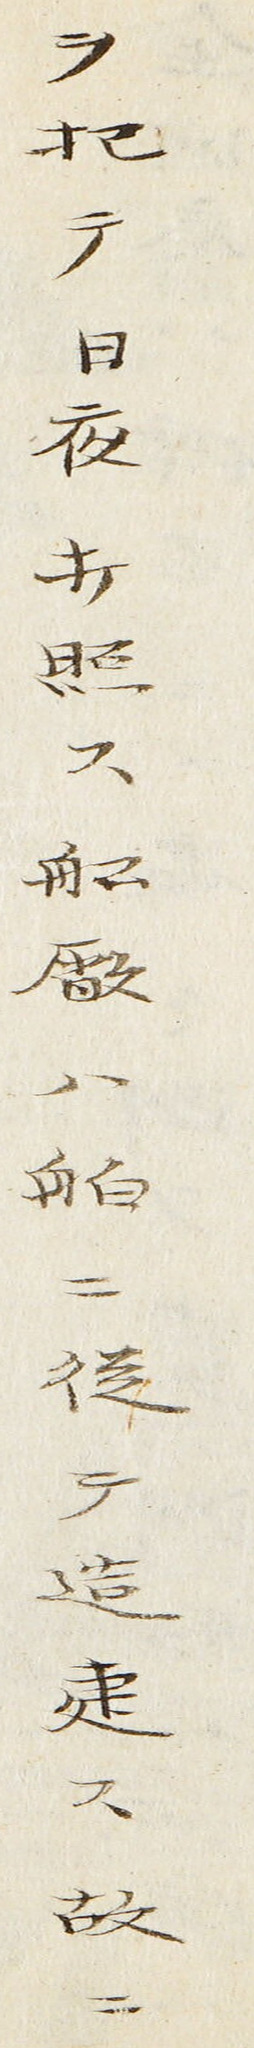ヲ把テ日夜打照ス船厰ハ舶ニ従テ造建ス故ニ
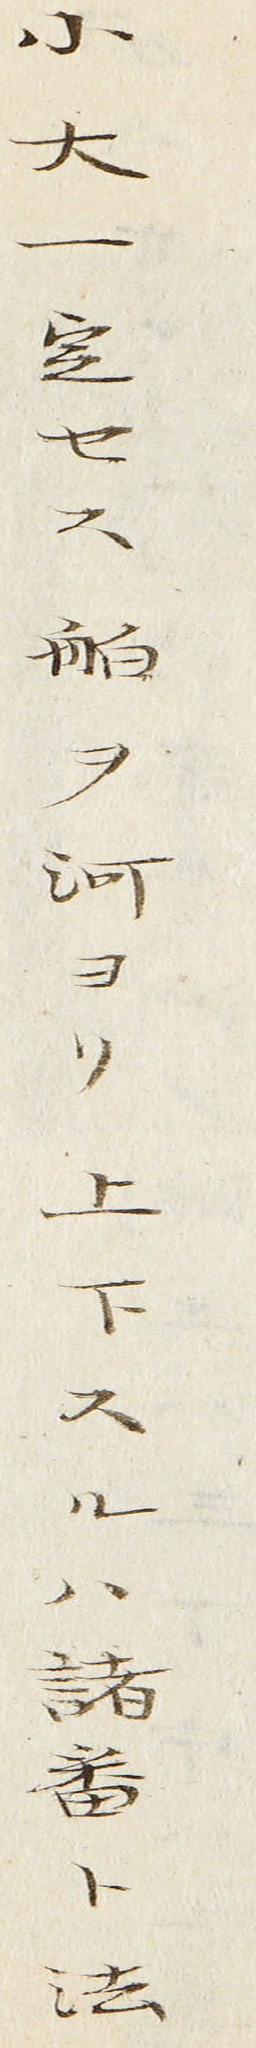小大一定セス舶ヲ河ヨリ上下スルハ諸番ト法
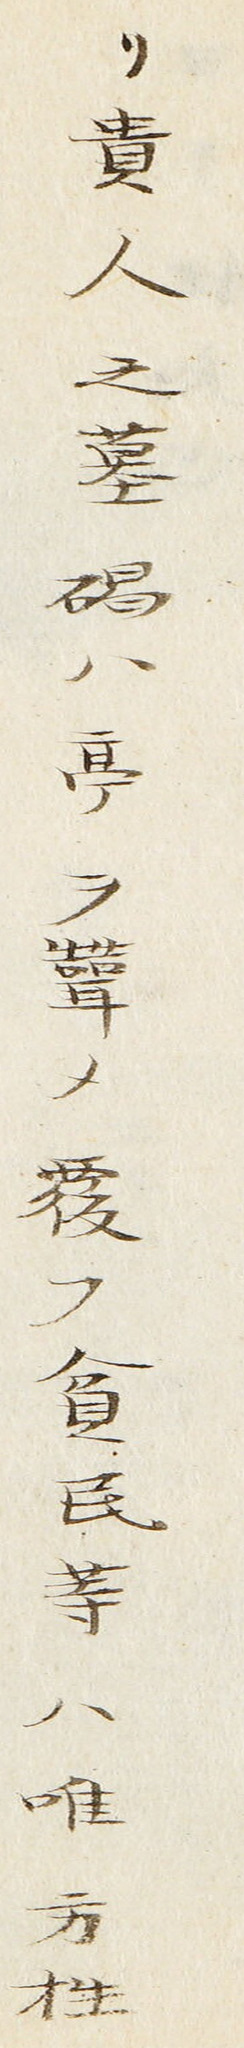リ貴人之墓碣ハ亭ヲシテ覆フ貧民等ハ唯方柱
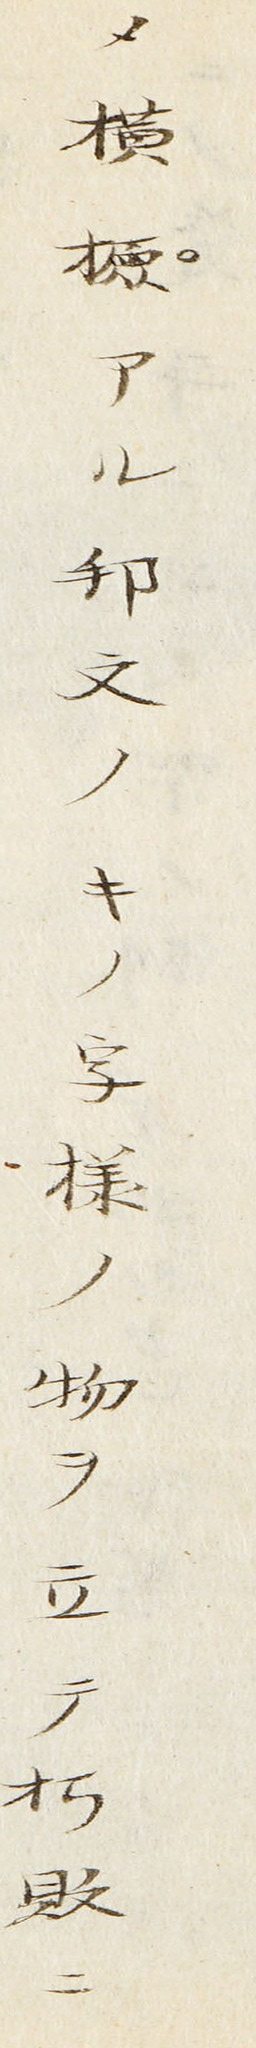シテ横アル邦文ノキノ字様ノ物ヲ立テ朽敗ニ
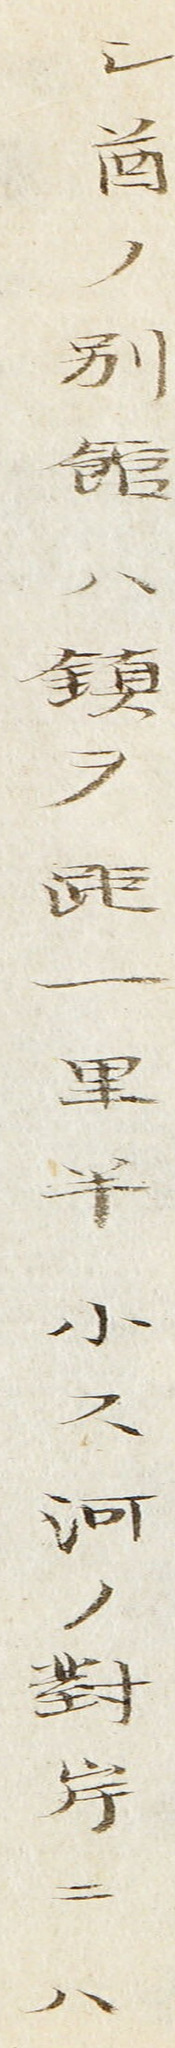シ酋ノ別館ハ鎮ヲ距一里半小ス河ノ対岸ニハ
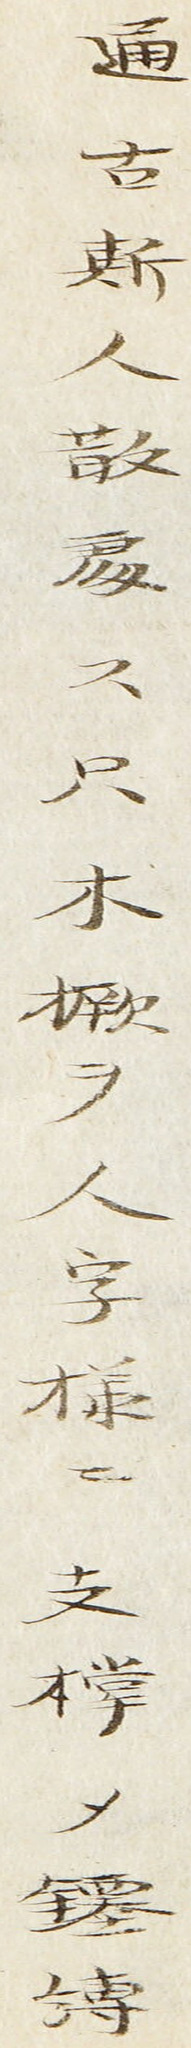通古斯人散処ス只木橛ヲ人字様ニ支撑シテ
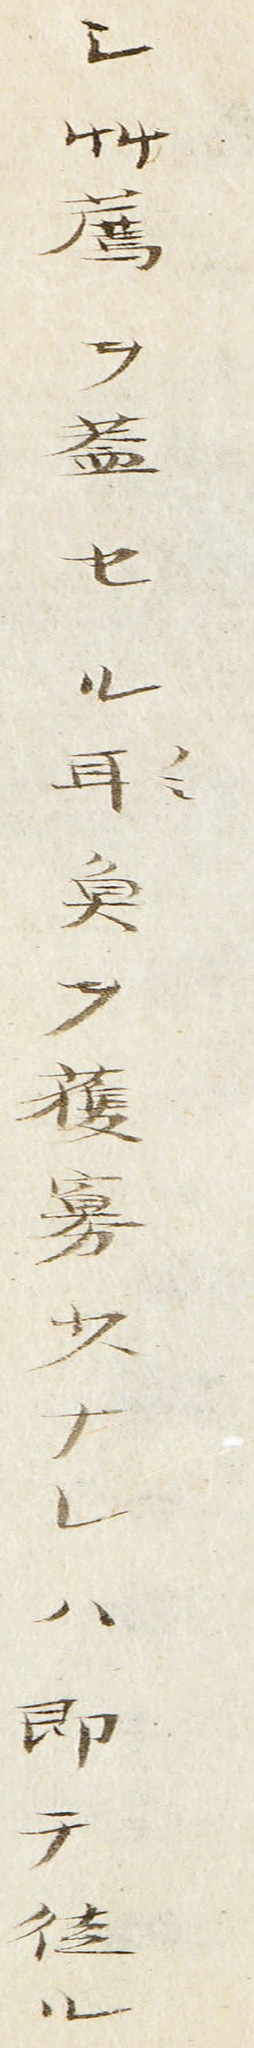シ艸薦ヲ葢セル耳魚ヲ獲寡少ナレハ即チ徒ル
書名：流蕃通書
